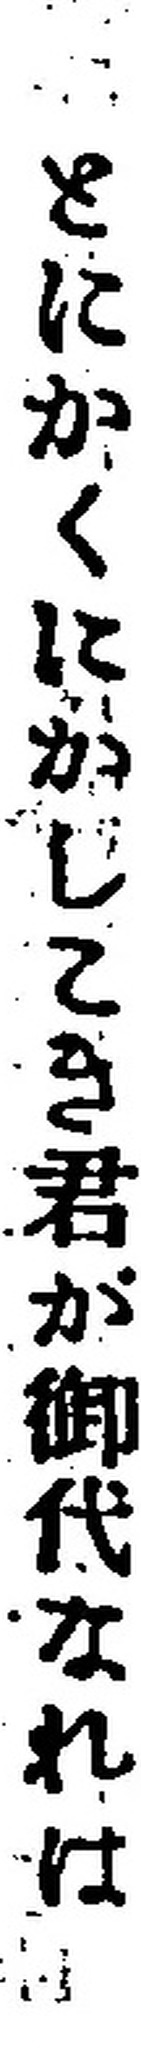とにかくにかしこき君が御代なれは
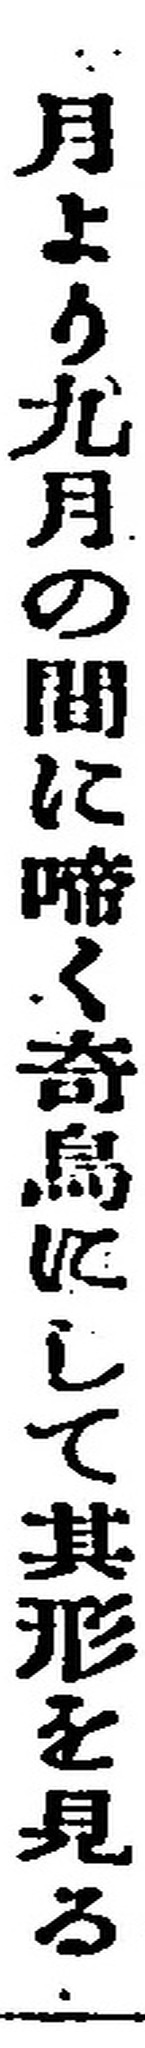月より九月の間に啼く奇鳥にして其形を見る
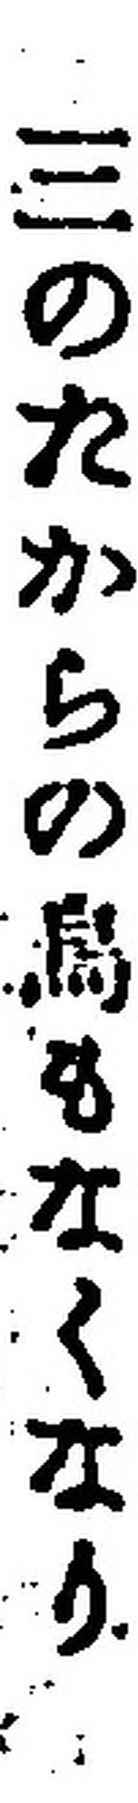三のたからの鳥もなくなり
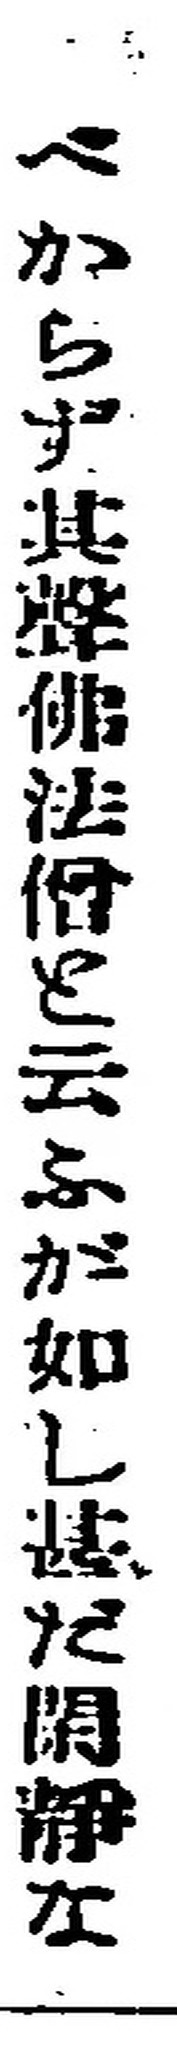べからず其声仏法僧と云ふが如し甚だ閑静な
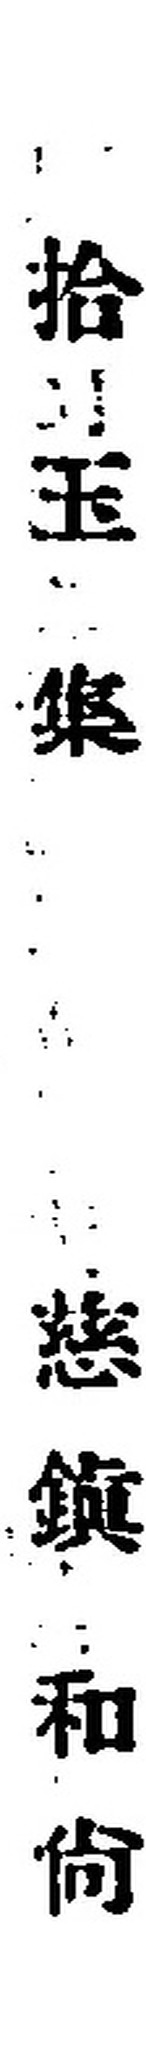拾玉集慈鎮和尚
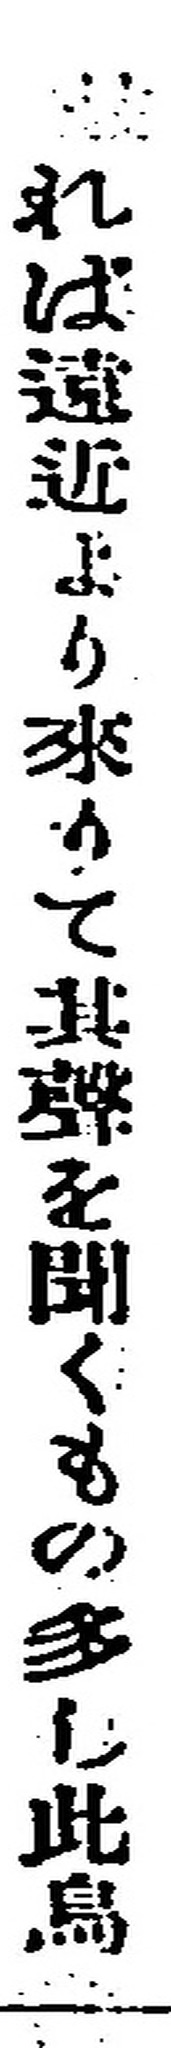れば遠近より来りて其声を聞くもの多し此鳥
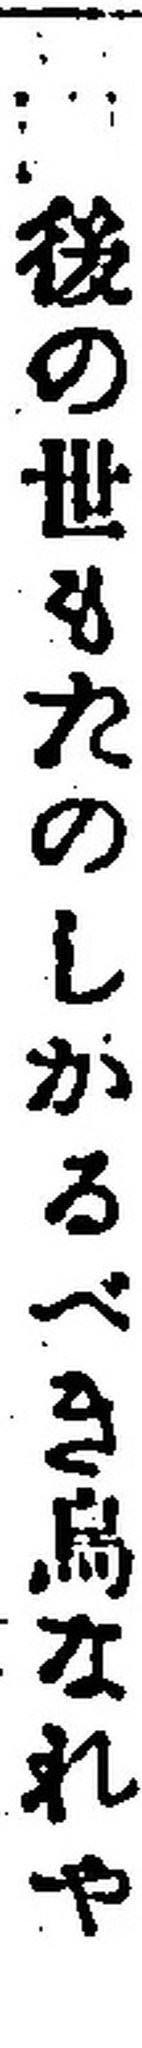後の世もたのしかるべき鳥なれや
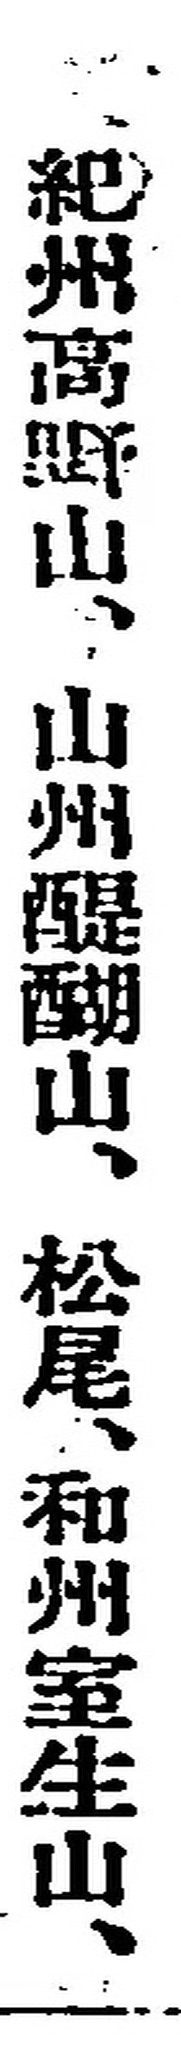紀州高野山、山州醍醐山、松尾、和州室生山、
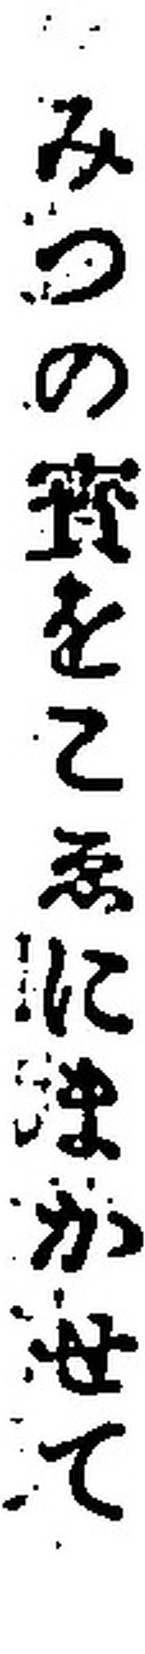みつの宝をこゑにまかせて
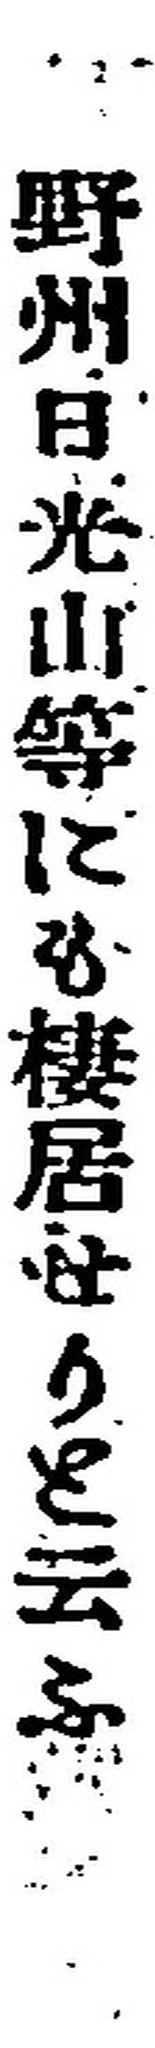野州日光山等にも棲居せりと云ふ
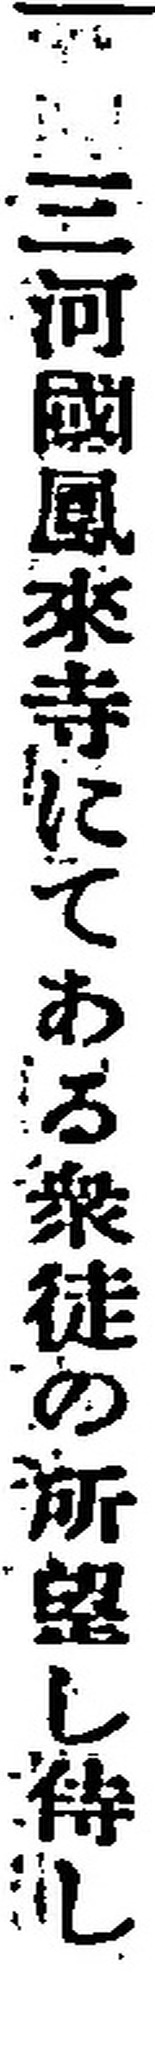三河国鳳来寺にてある衆徒の所望し侍し
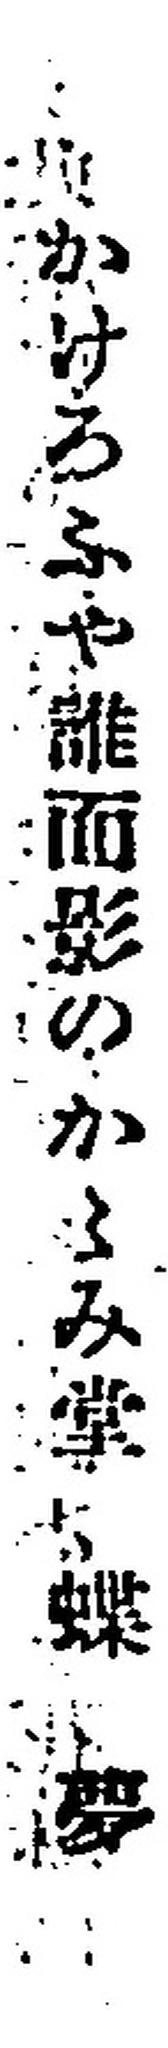かけろふや誰面影のかゝみ堂蝶夢
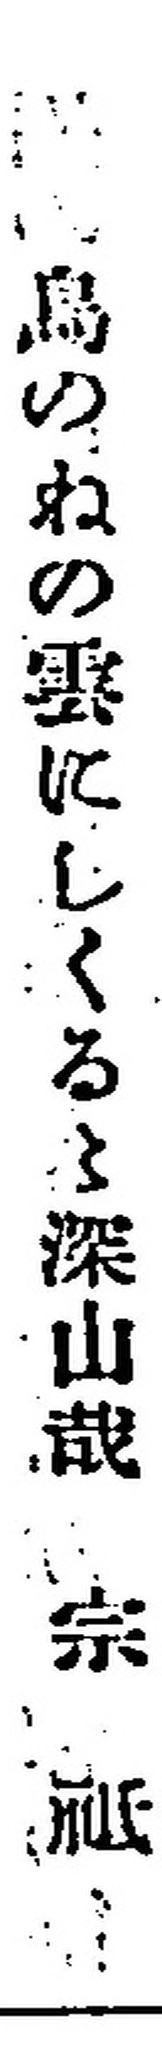鳥のねの雲にしくるゝ深山哉宗祇
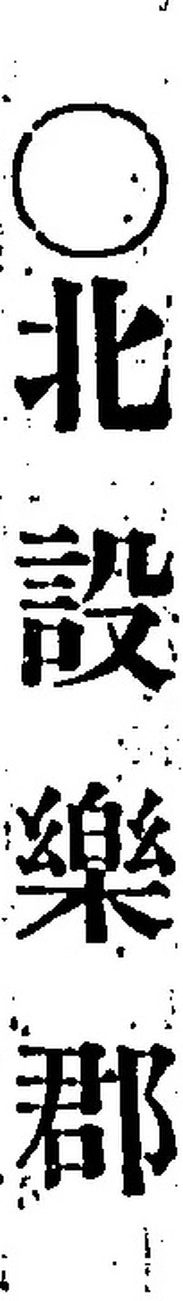○北設楽郡
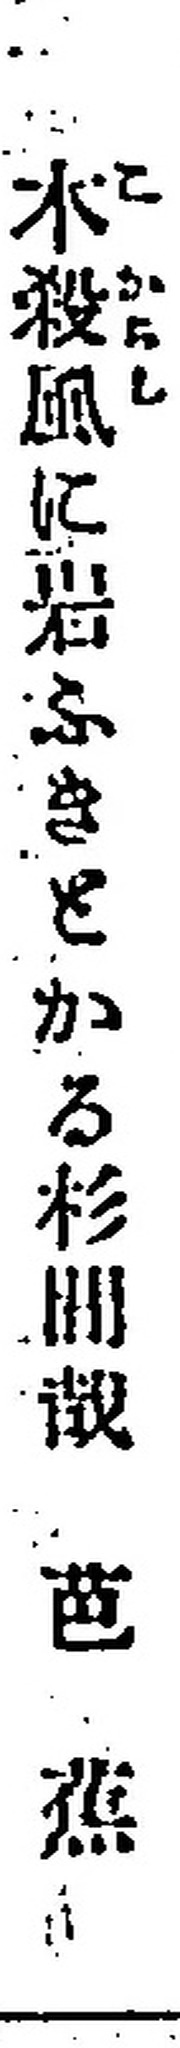木殺風に岩ふきとかる杉間哉芭蕉
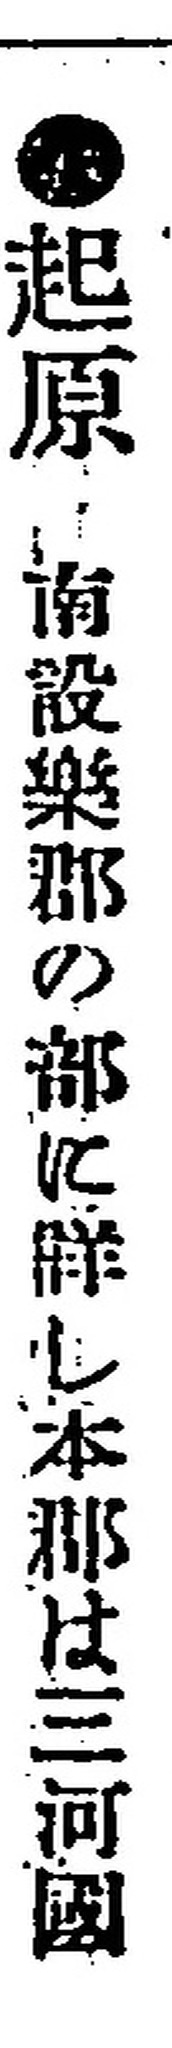●起原南設楽郡の部に詳し本郡は三河国
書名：東参名勝案内
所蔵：国立国会図書館 National Diet Library, JAPAN
